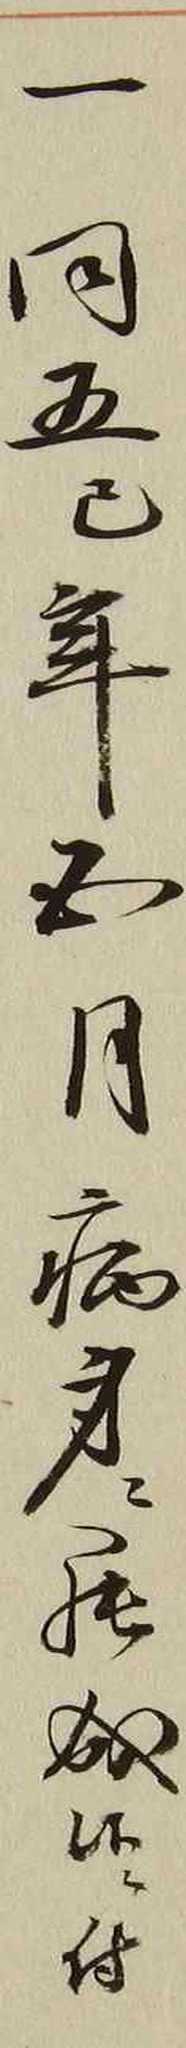一同五巳年五年病身ニ罷り成り候ニ付き
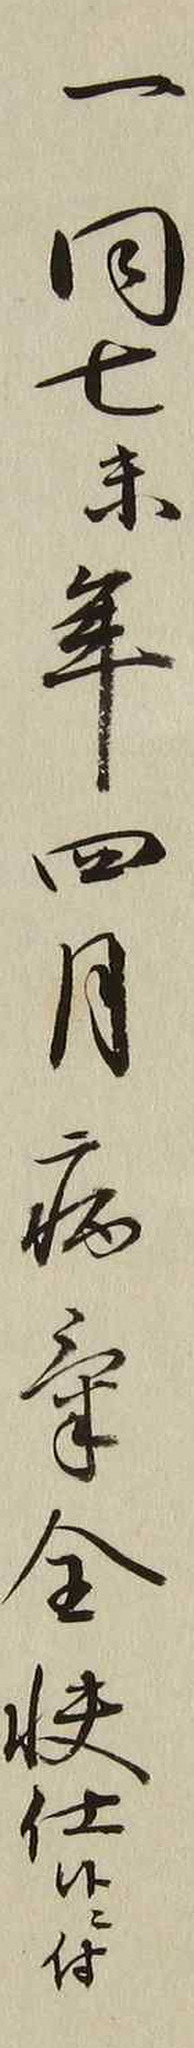一同七未年四月病気全快仕り候ニ付き
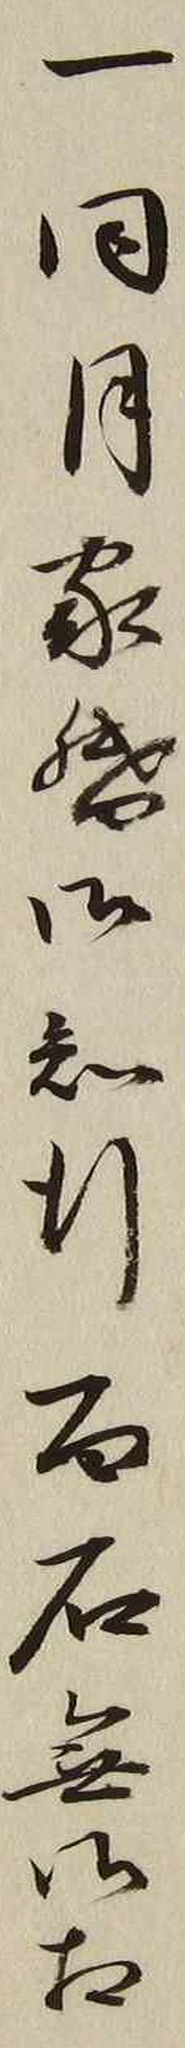一同月家督御知行百石御相違無く
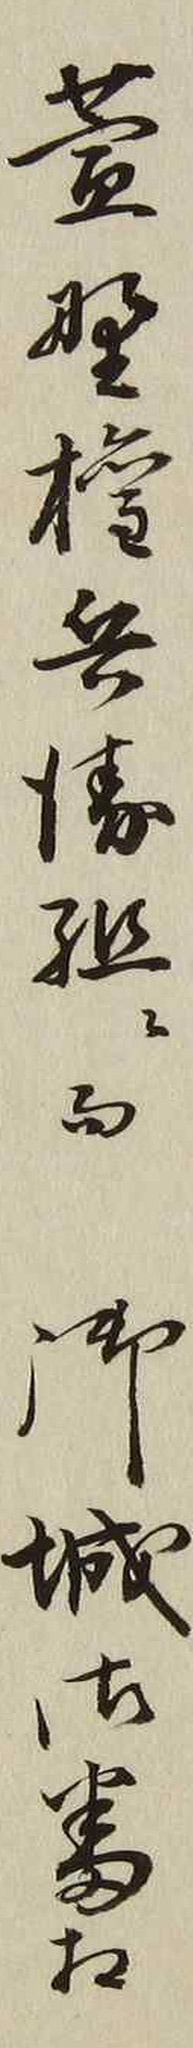萱野権兵衛組ニて御城御番相
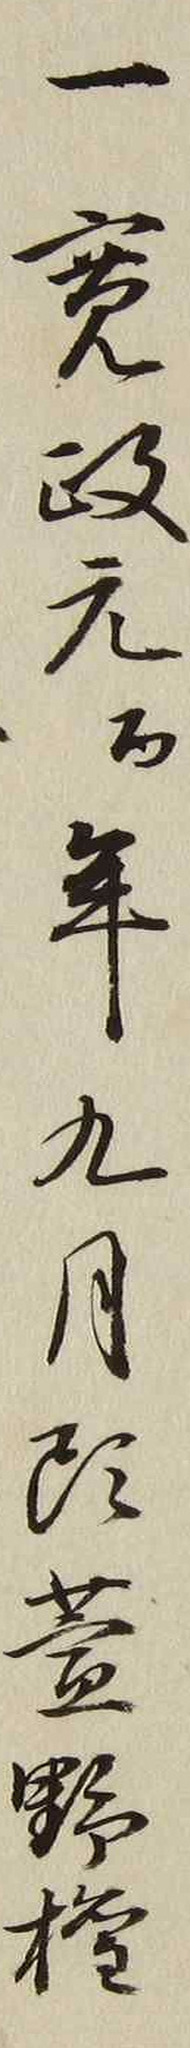一寛政元酉年九月頭萱野権
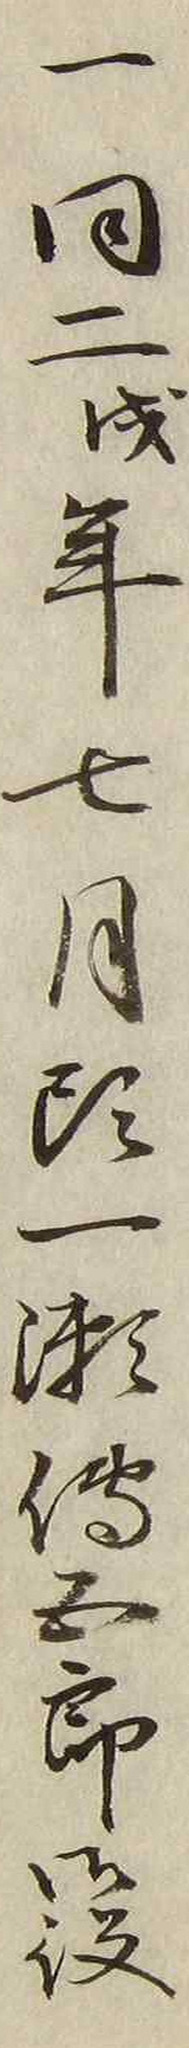一同二戌年七頭一瀬傳五郎御役

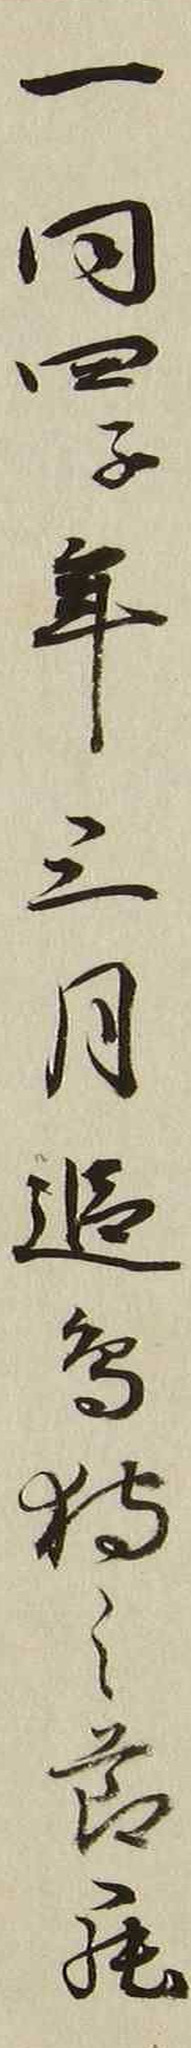一同四子年三月追鳥狩之節罷り
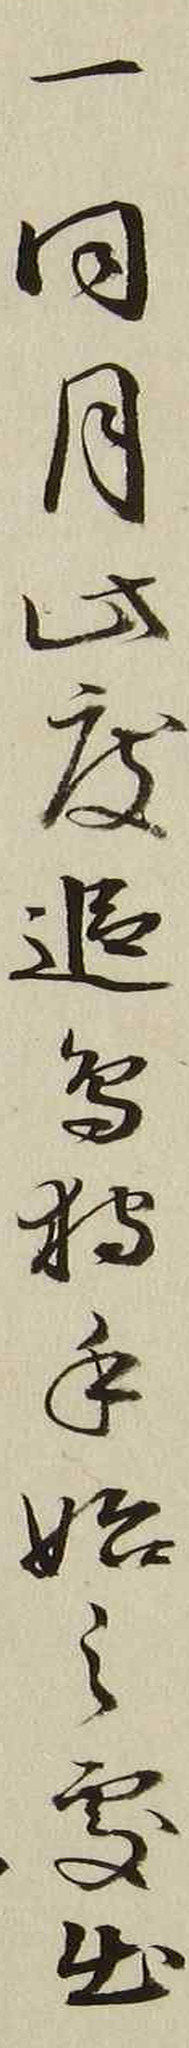一同月此度追鳥狩手始め之処出
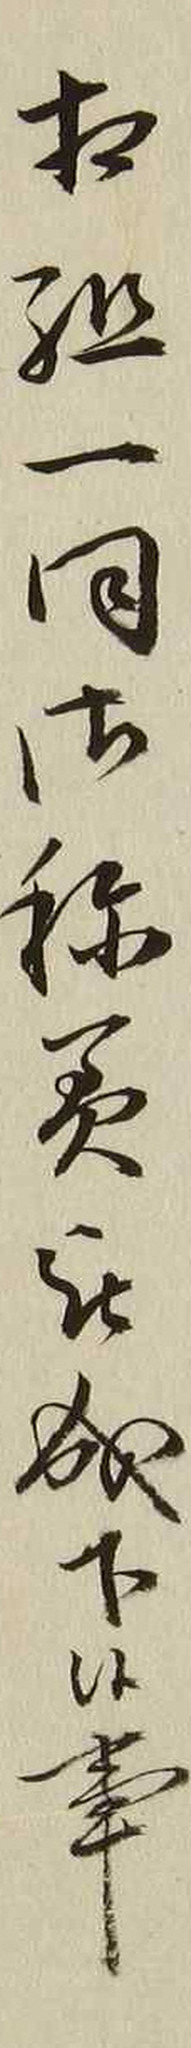相組一同御称美成し下され候事
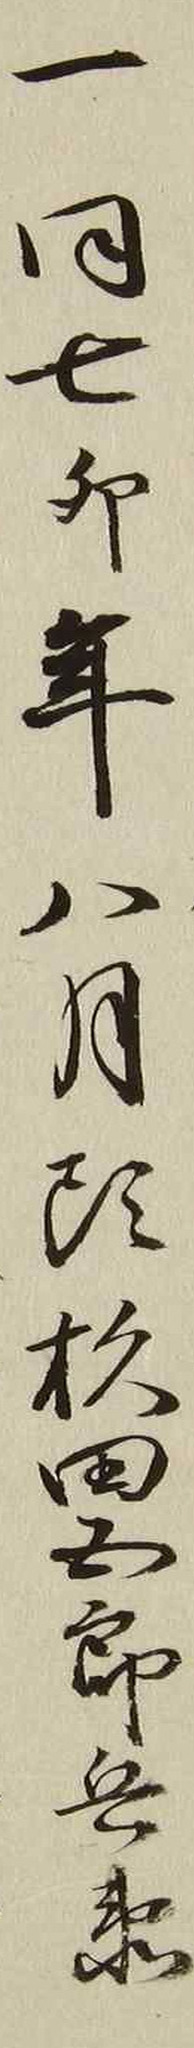一同七卯年八月頭杉田五郎兵衛
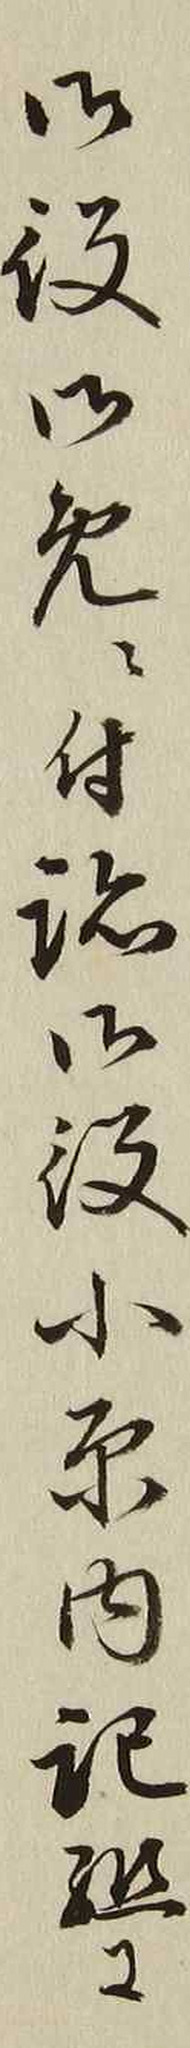御役御免ニ付き諸御役小原内記組ニ
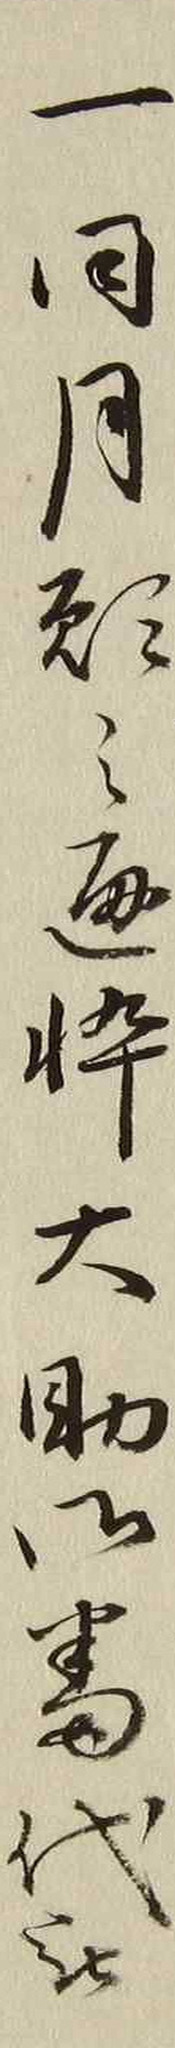一同月願い之通り倅大助御番代
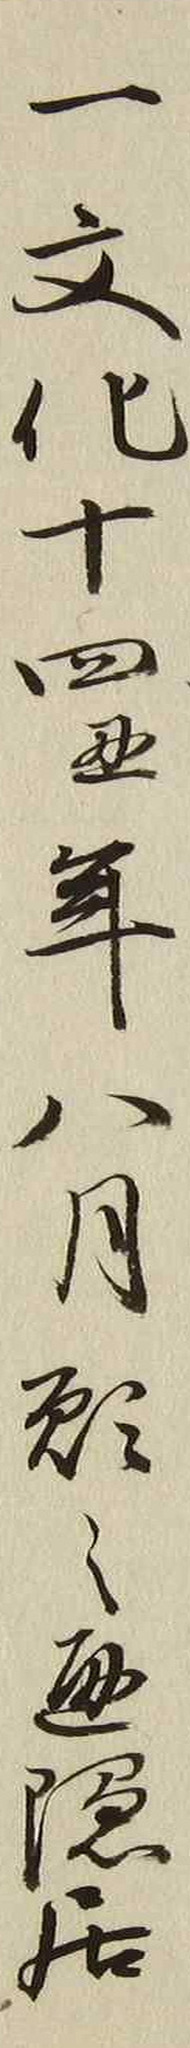一文化十四丑年八月願い之通り隠居
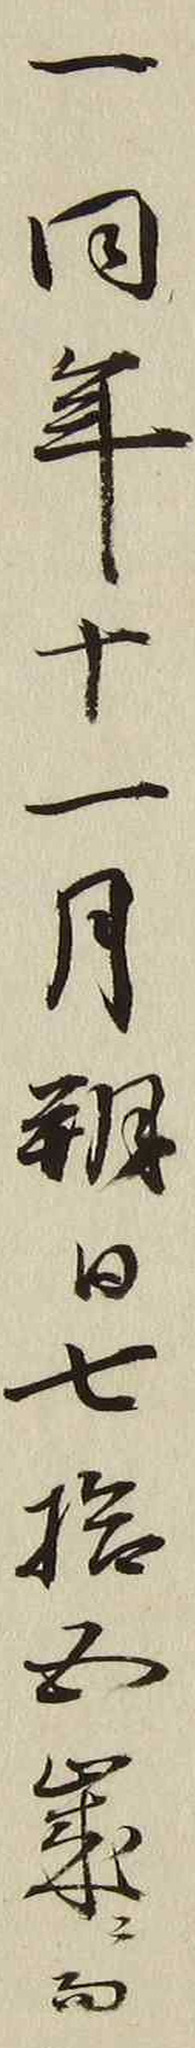一同年十一月朔日七拾五歳ニて
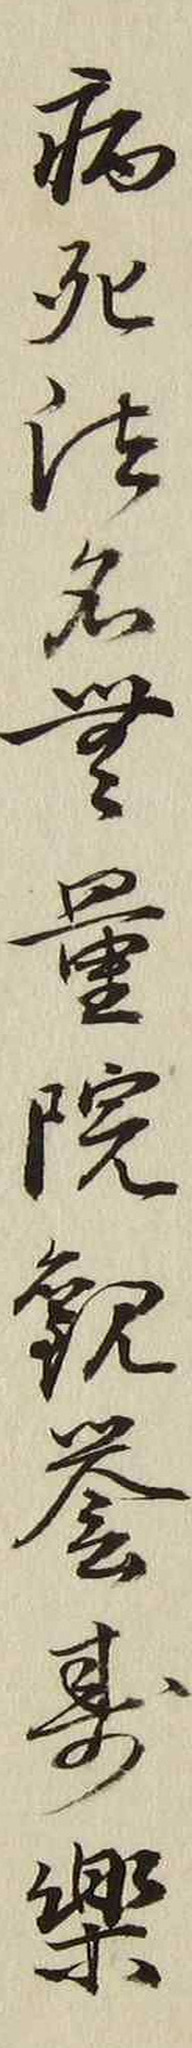病死法名無量院観誉寿楽
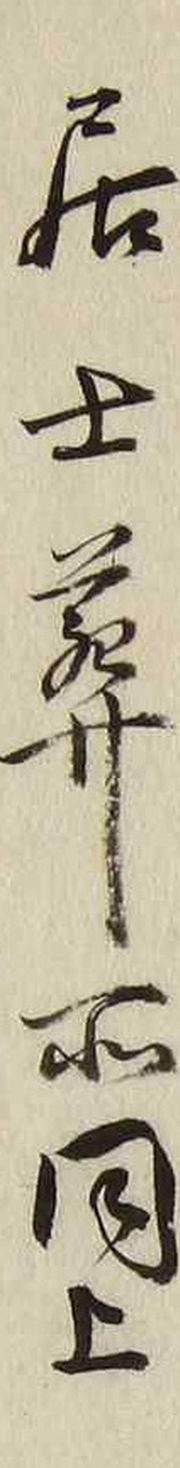居士葬処同上
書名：諸士系譜　巻之19　い之部19
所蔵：会津若松市立会津図書館
